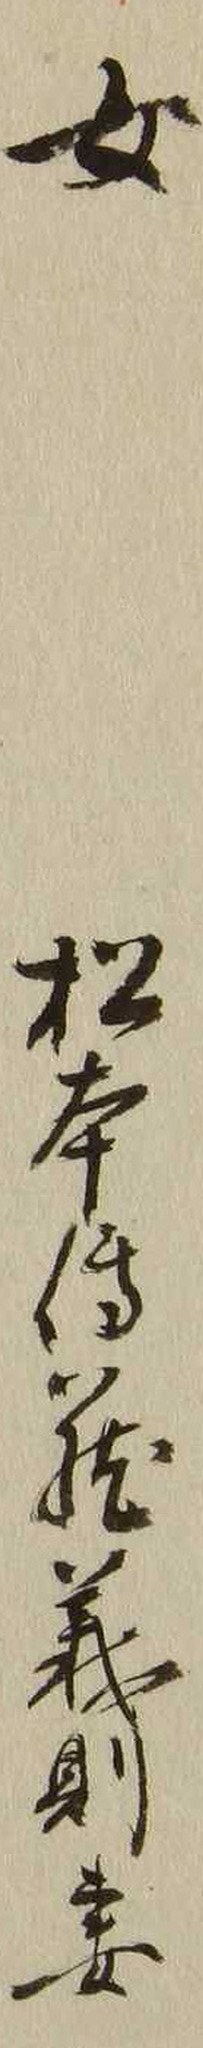女松本伝蔵義則妻
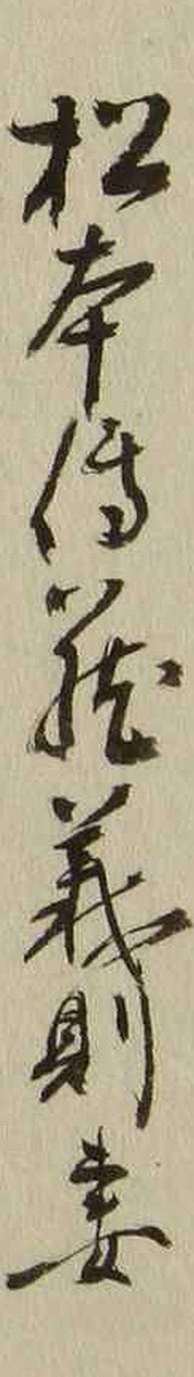女松本伝蔵義則妻
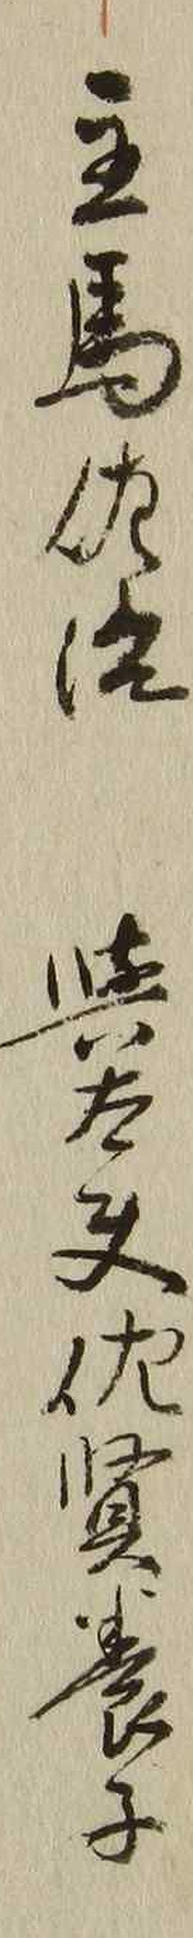主馬佐治与太夫佐賢養子
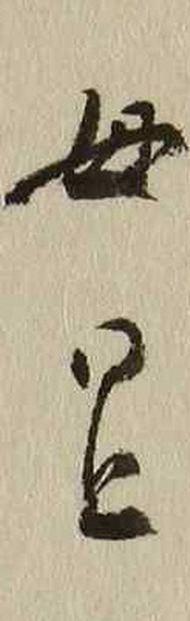母同上
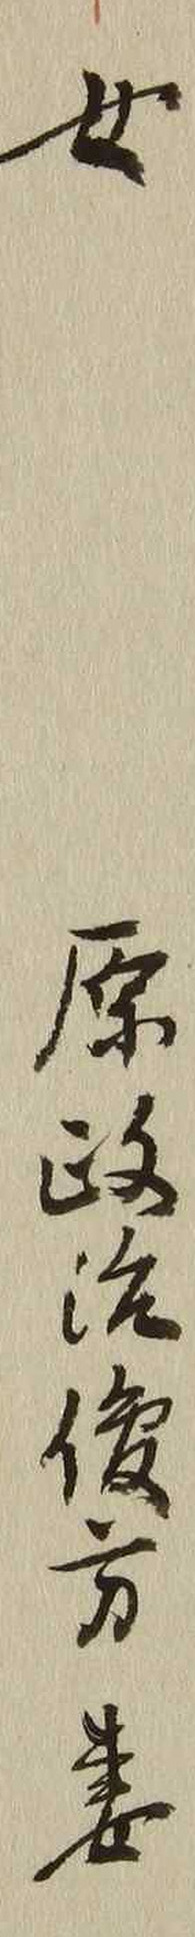女原政治俊方妻
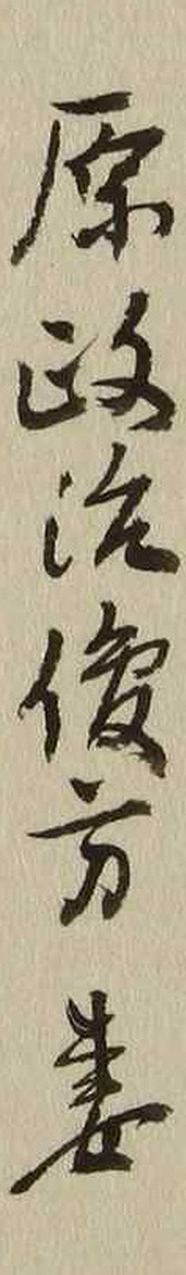女原政治俊方妻
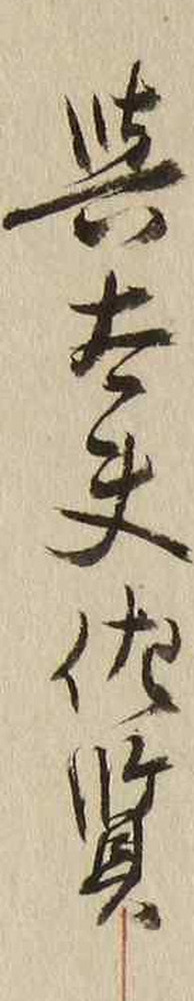与太夫佐賢
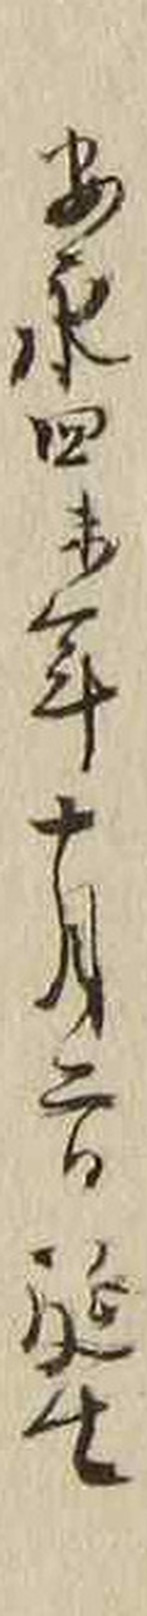安永四未年十月二日誕生

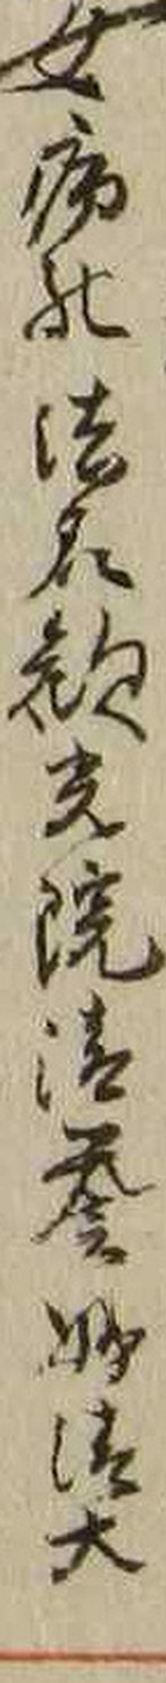病死法名観光院清誉妙清大
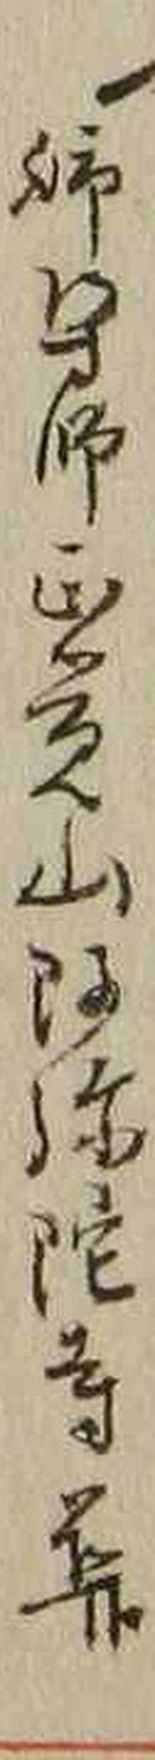姉導師正覚山阿弥陀寺葬
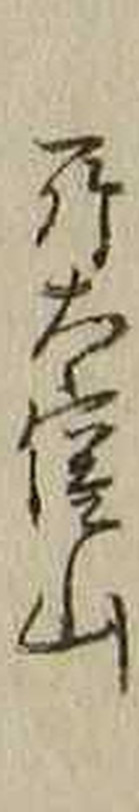所大窪山
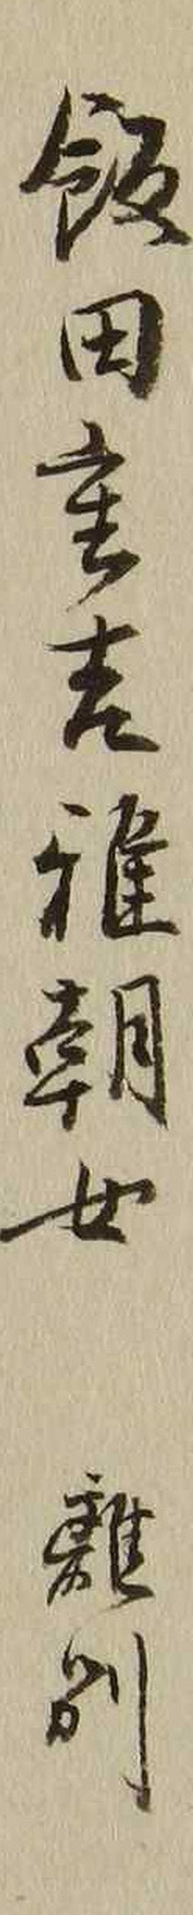飯田重吉雅朝女離別
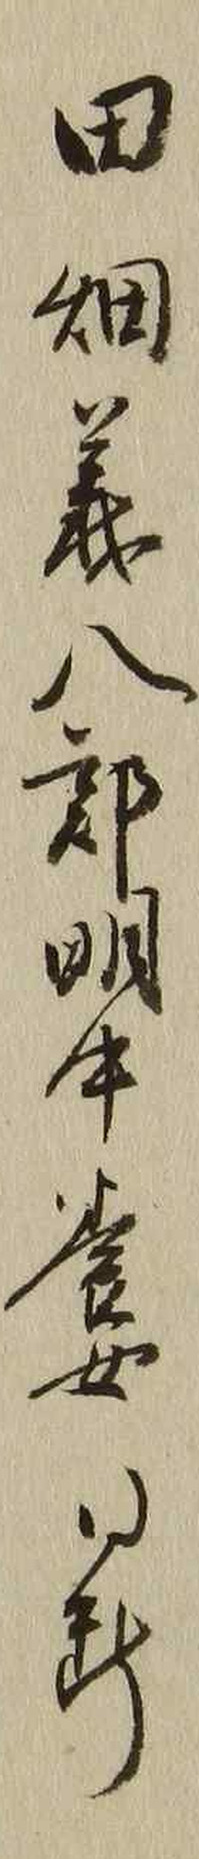田畑義八郎明中養女同断
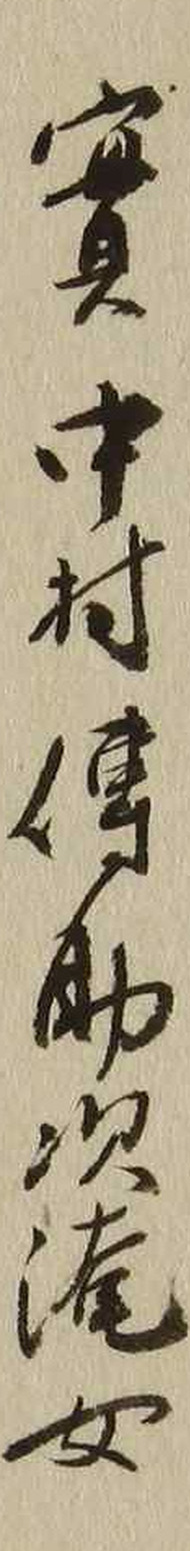実中村伝助次淹女
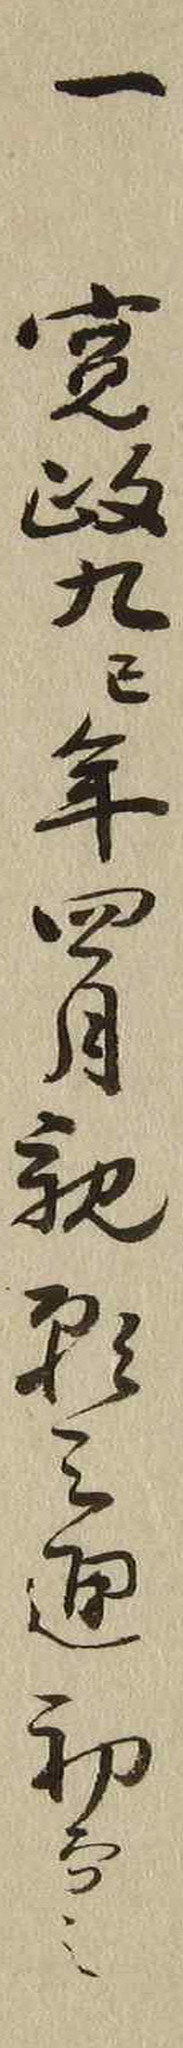一寛政九巳年四月親願之通初而
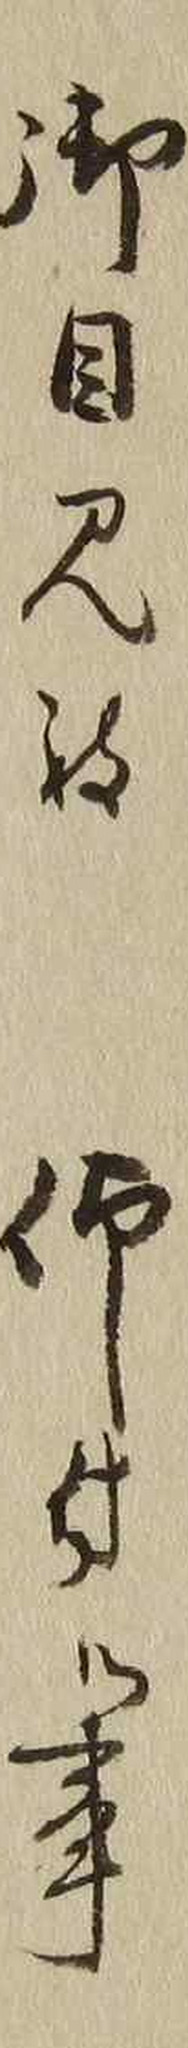御目見被仰付候事
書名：諸士系譜　巻之221　ま之部2
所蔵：会津若松市立会津図書館
